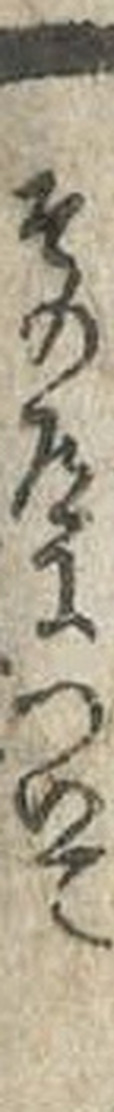その道について
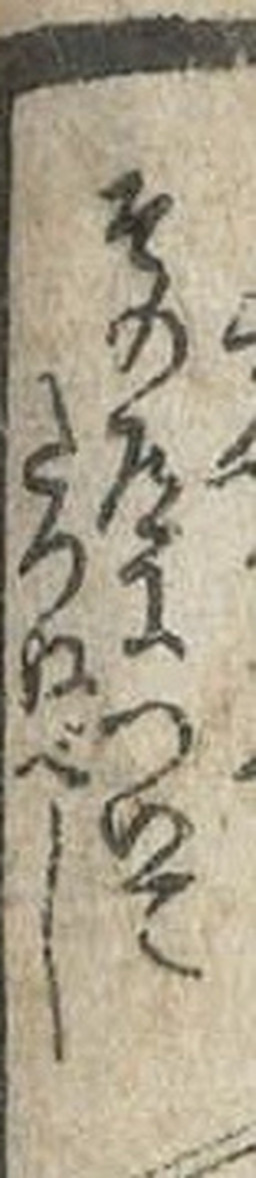たつぬべし
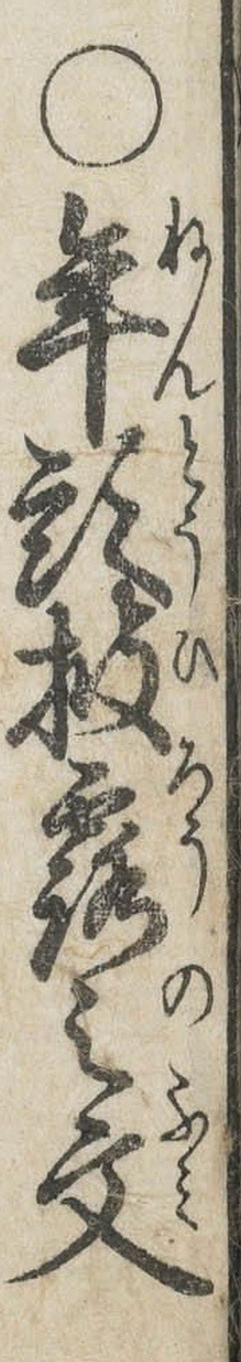○年頭披露之文
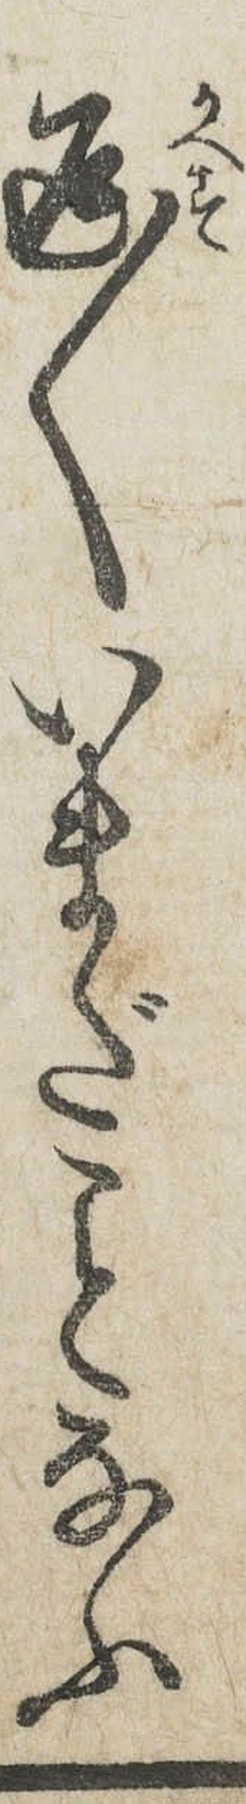返〳〵いまだことなふ
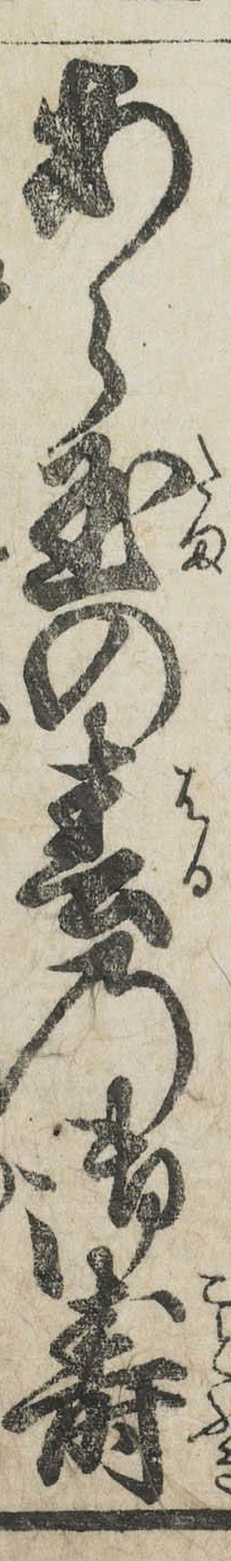あら玉の春の御寿
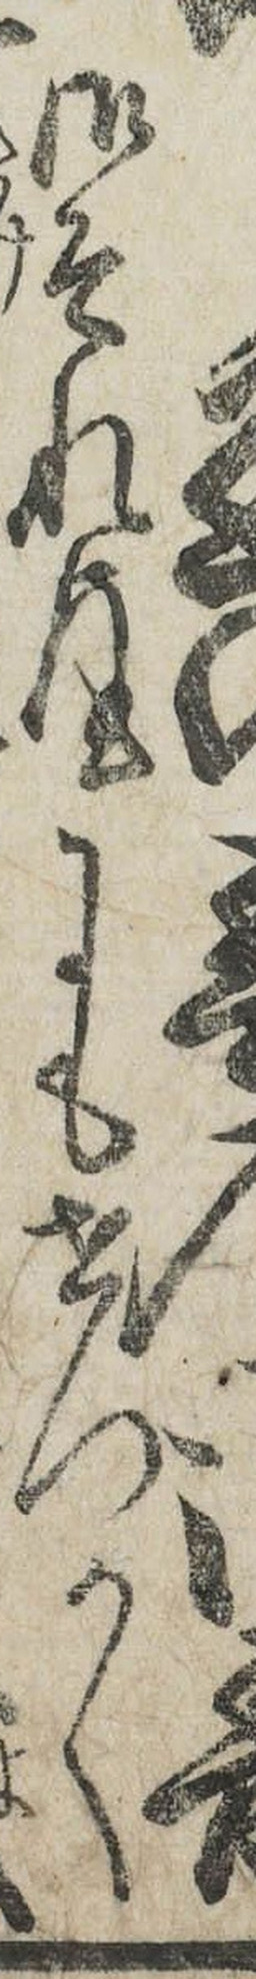御それさまにもせつかく
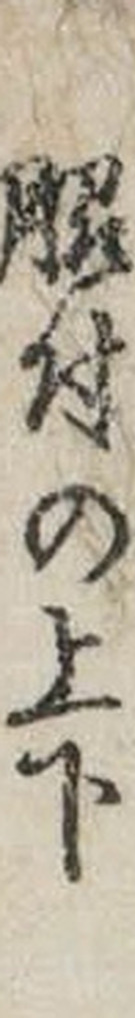脇付の上下
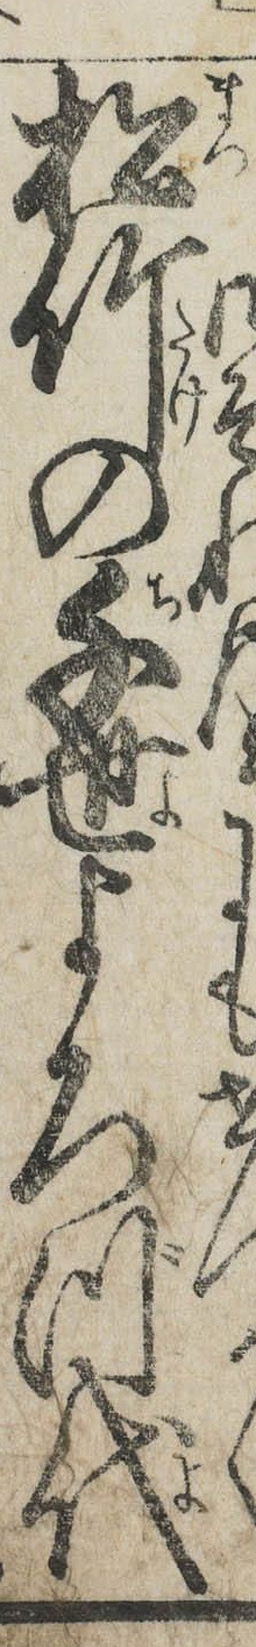松竹の千世よろづ代
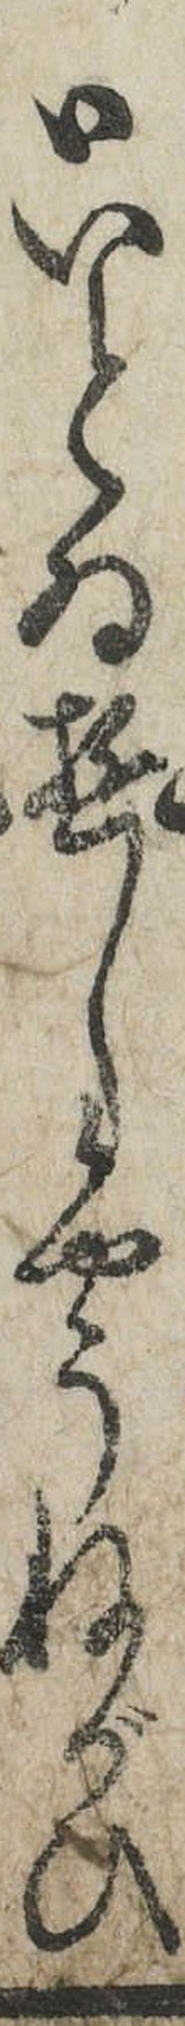御いとゐ遊し候やうねがひ
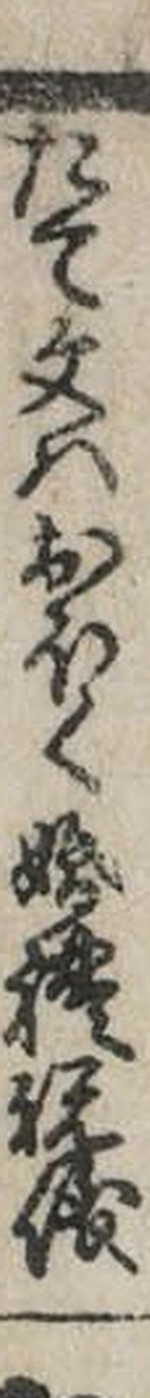たて文はおほく婚礼祝儀
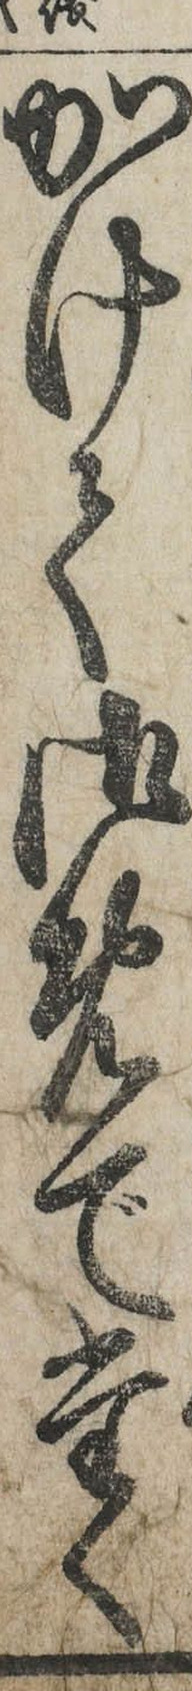かけて御めでたく
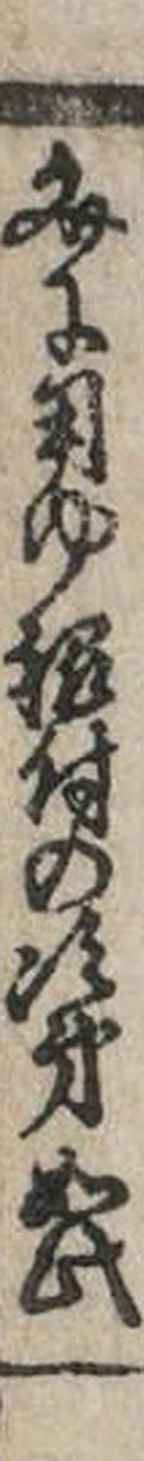文に用ゆ脇付の次第如此

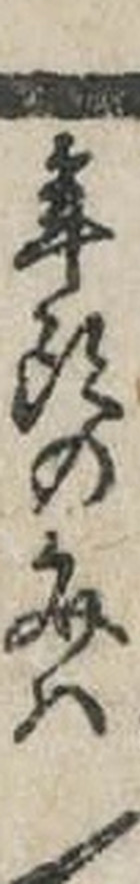年頭の文は
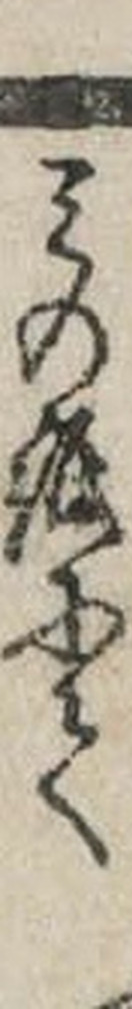みの紙にて
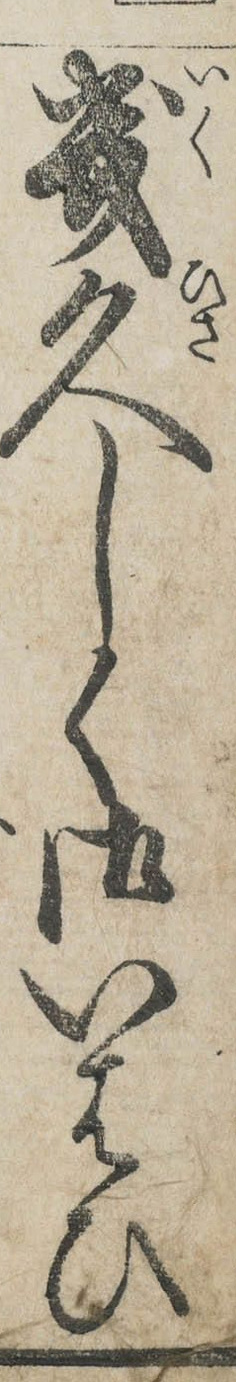幾久しく御いはひ
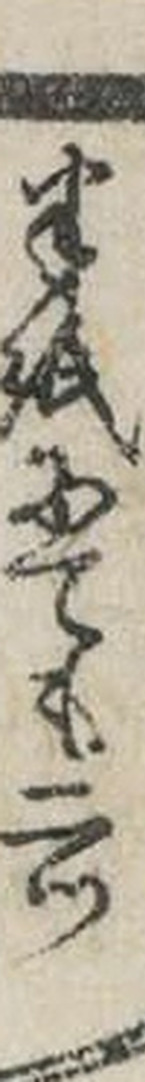半紙にても二つ
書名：頭書萬用婦人手紙之文言
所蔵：東京学芸大学教育コンテンツアーカイブ
